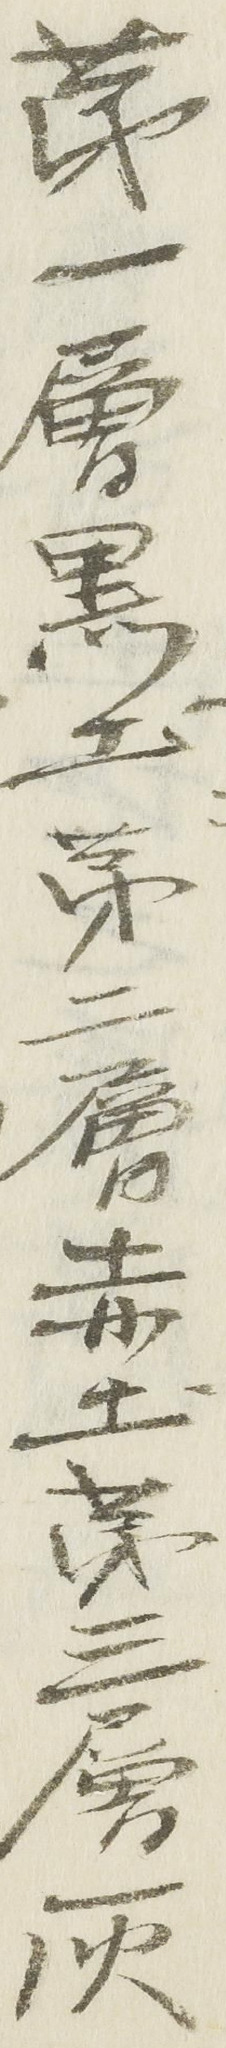第一層黒土第二層赤土第三層灰
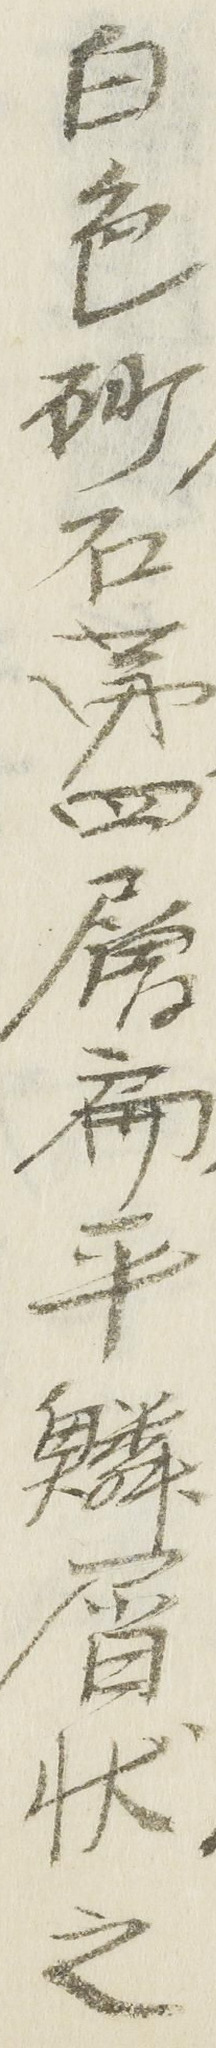白色砂石第四層扁平鱗屑状之

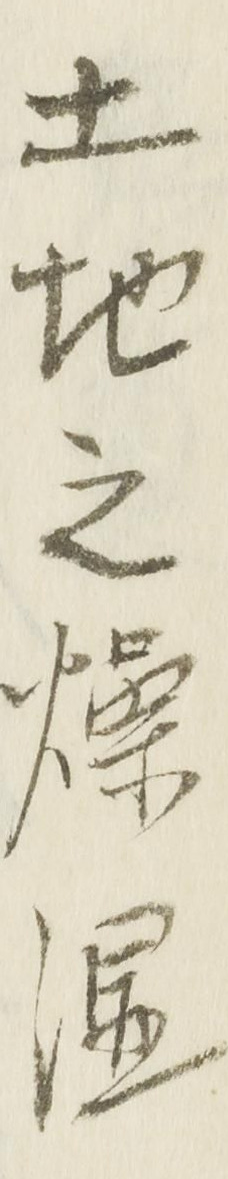土地之燥湿
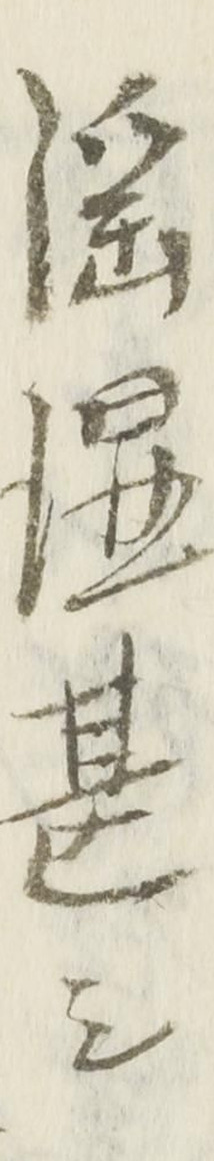揺湿甚シ
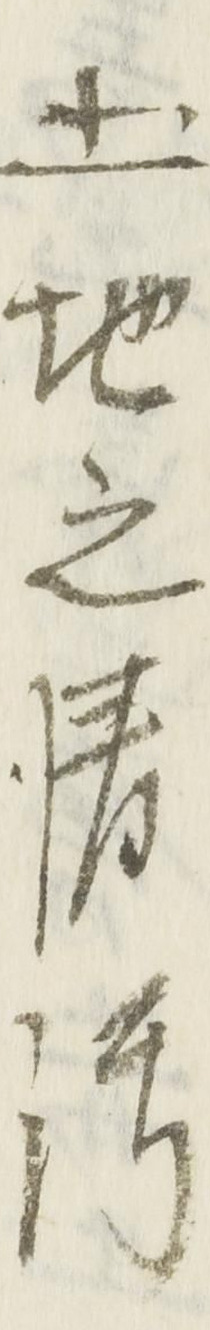土地之燥湿
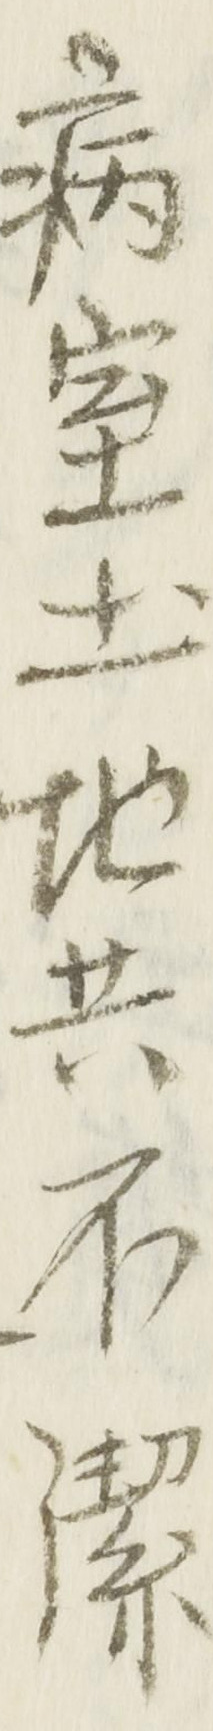病室土地共不潔
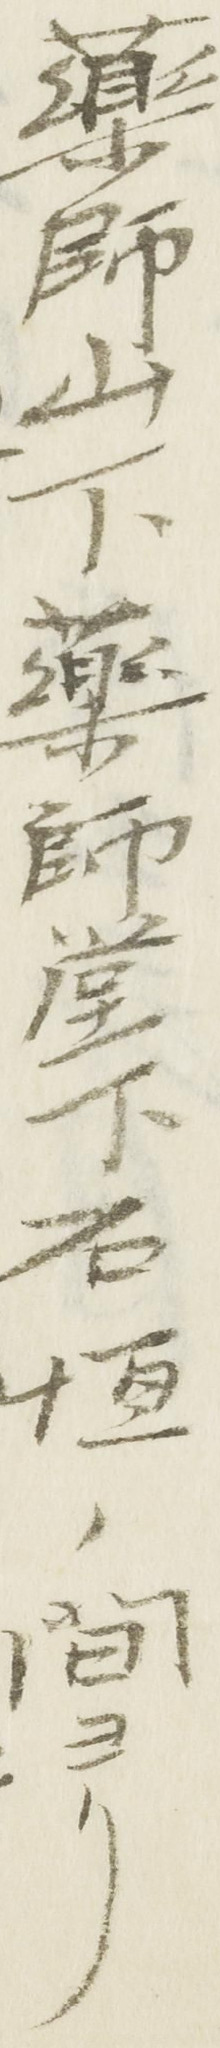薬師山下薬師堂下石垣ノ間ヨリ
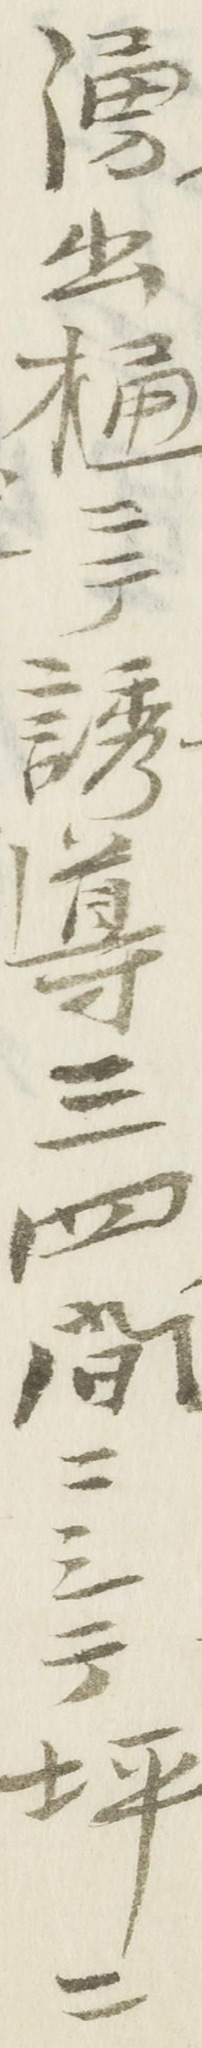湧出樋ニテ誘導三四間ニシテ坪ニ
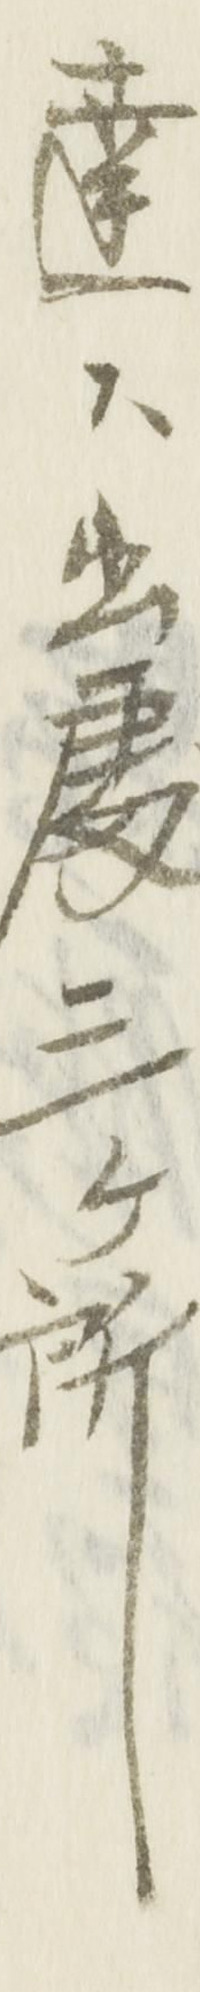達ス出処三ケ所
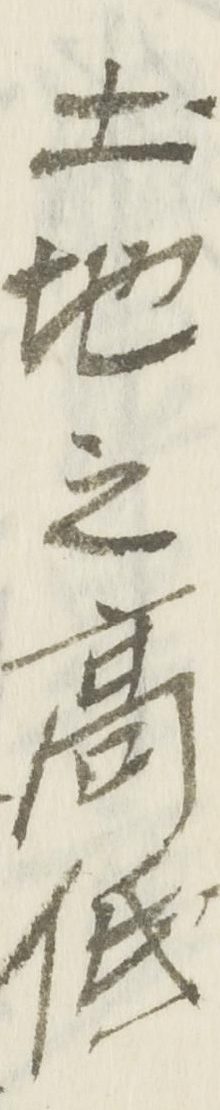土地之高低
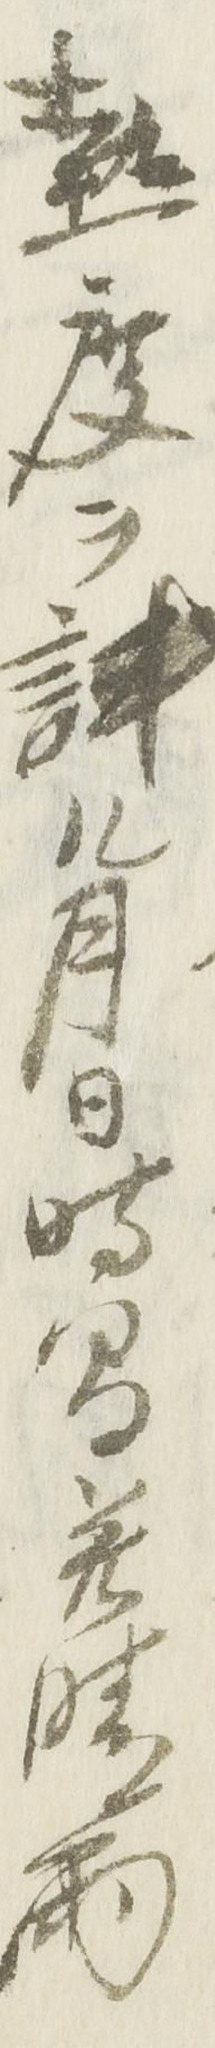熱度ヲ計ル月日時間幷晴雨
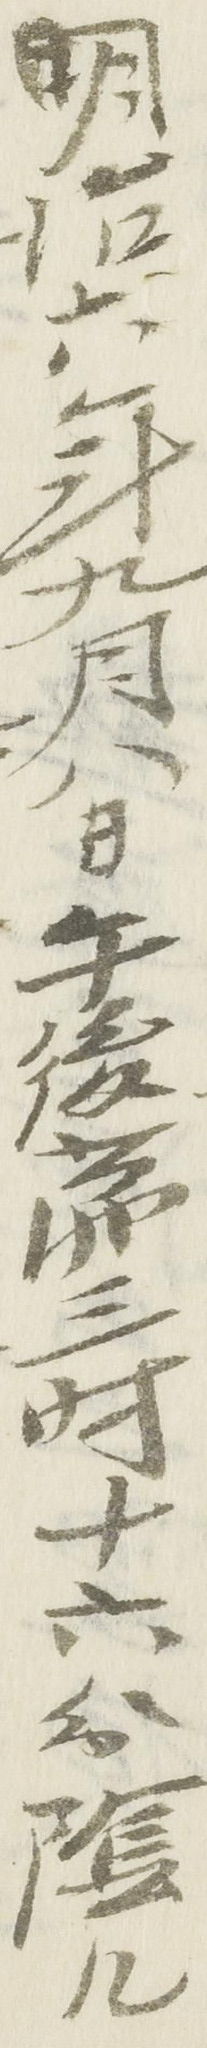明治六年九月八日午後第三時十六分陰ル
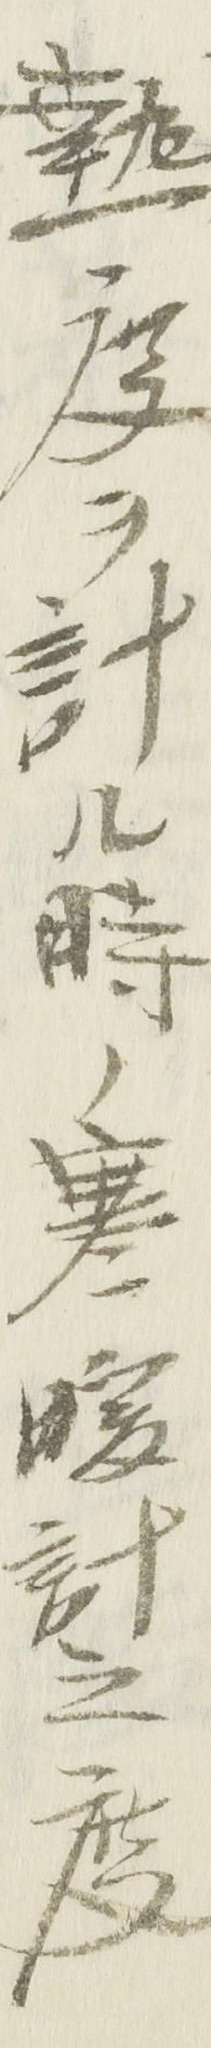熱度ヲ計ル時ノ寒暖計之度
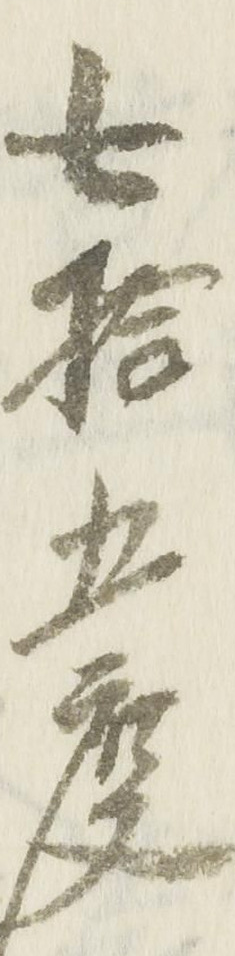七拾五度
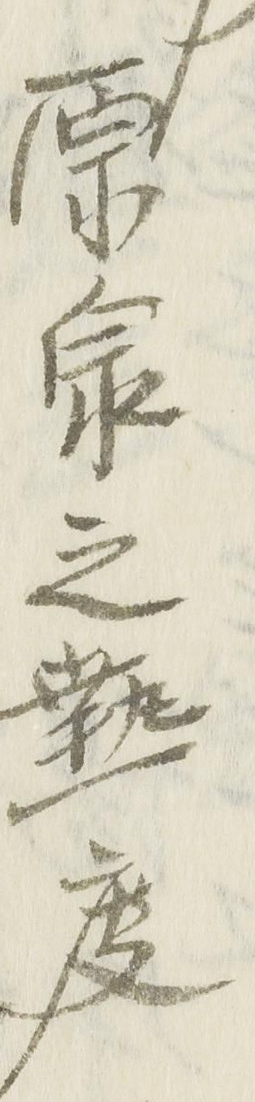原泉之熱度

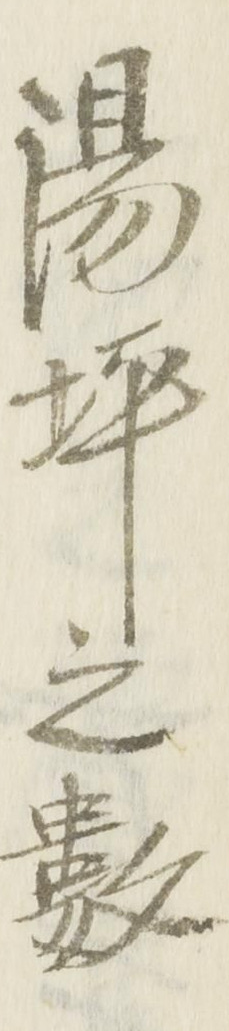湯坪之数
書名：温冷泉試験表
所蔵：東京大学地震研究所図書室 Earthquake Research Institute Library, The University of Tokyo, JAPAN
